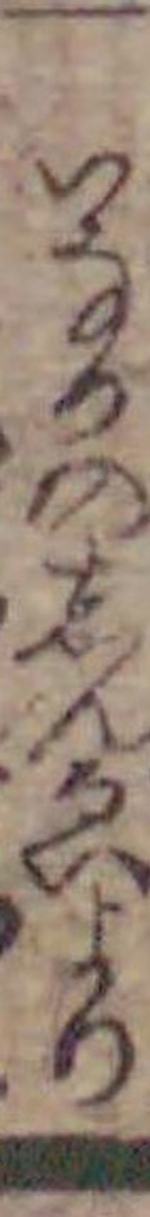いなかのしんるいより
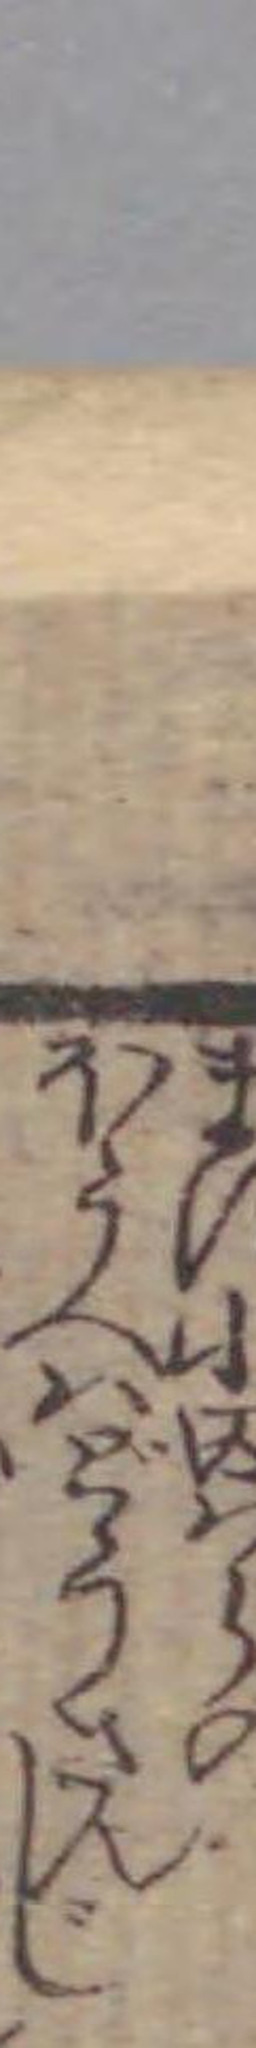ほうへはどうさんじ
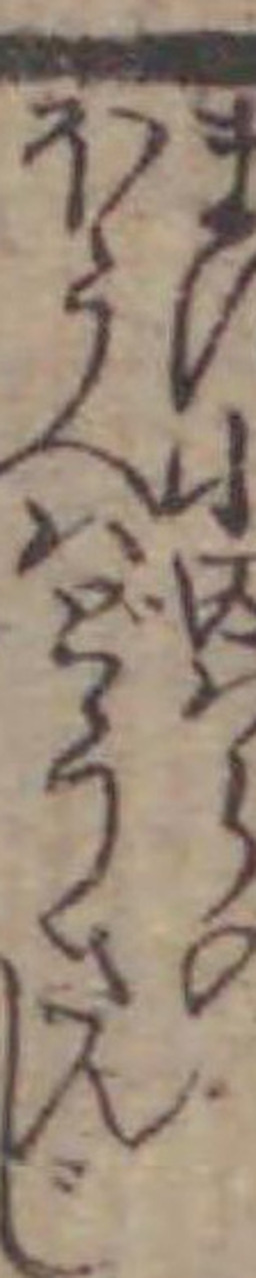ほうへはどうさんじ
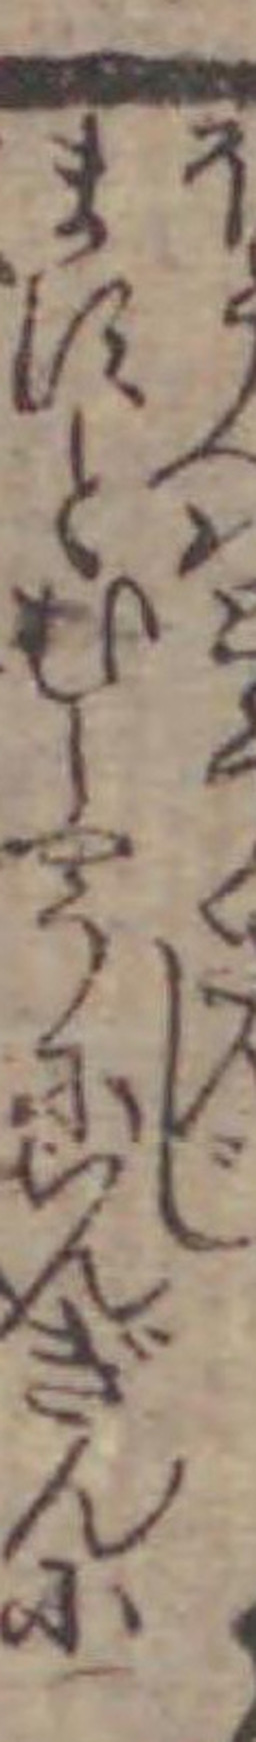ますとむしやうにいんぎんに
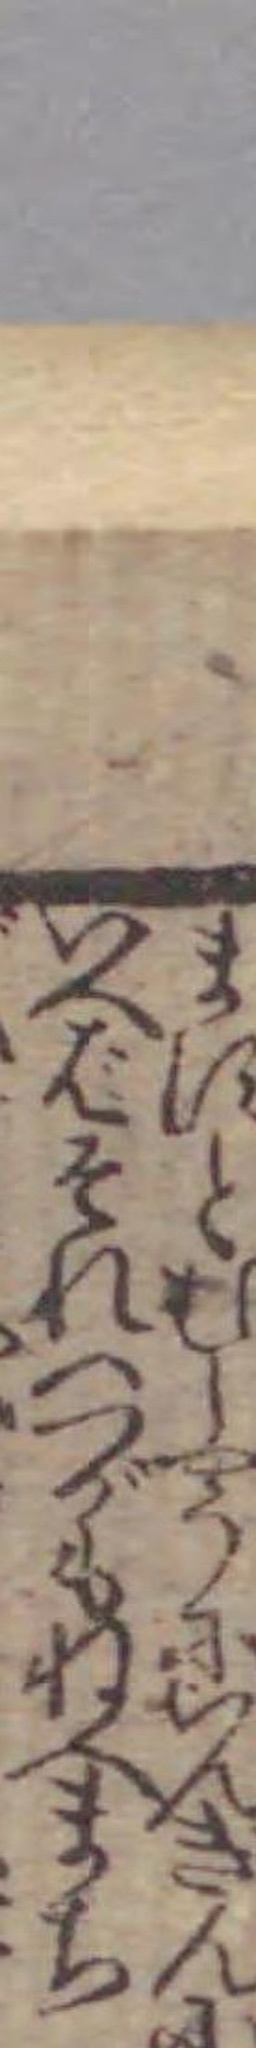いへばそれはつがもねへまち
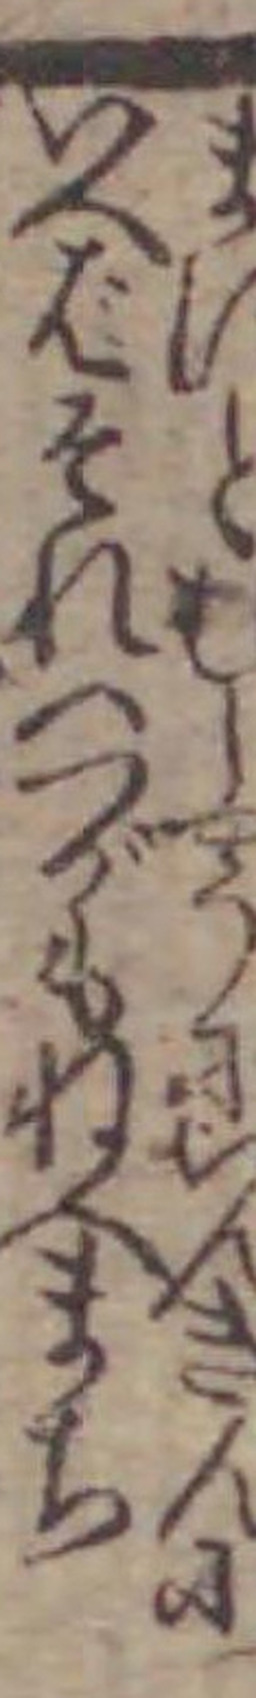いへばそれはつがもねへまち
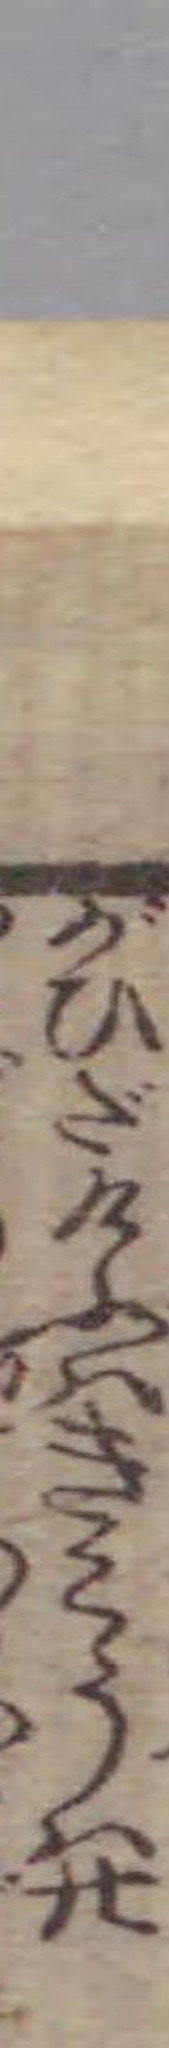がひだけふはきこうは廿
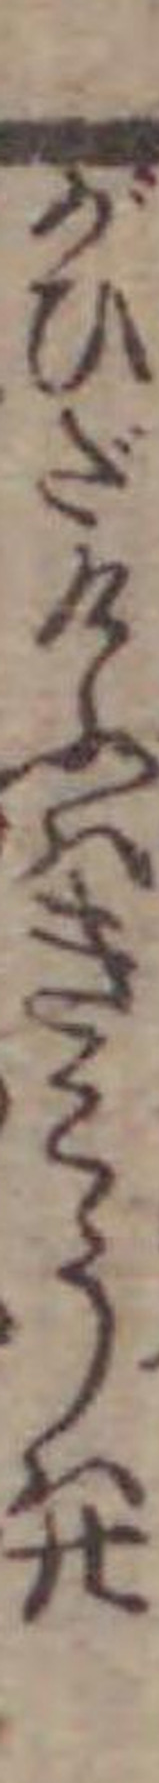がひだけふはきこうは廿
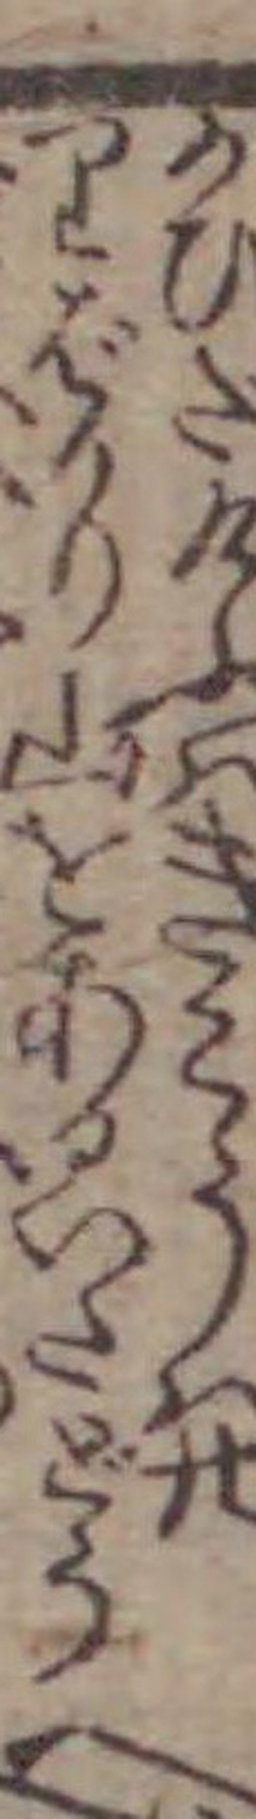里ばかり山をあるいたどう
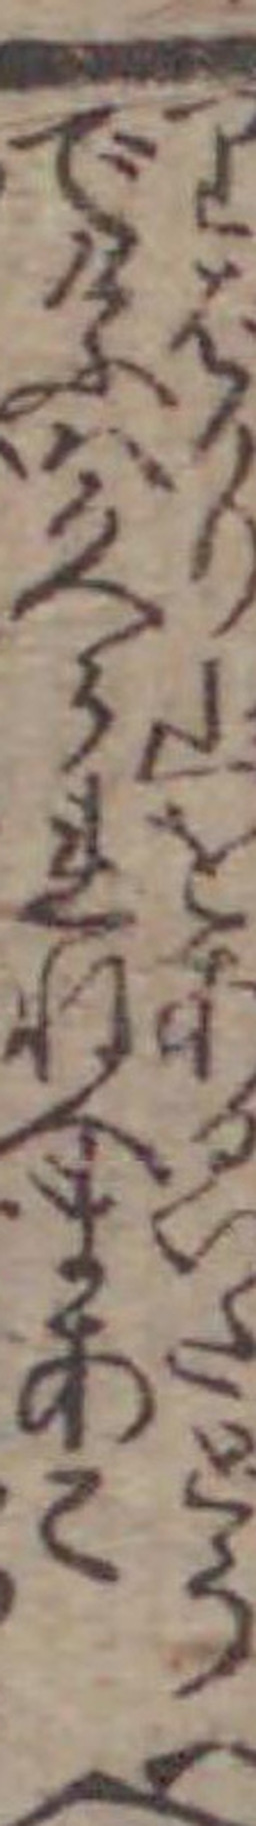でけふはかへられねへまあこ
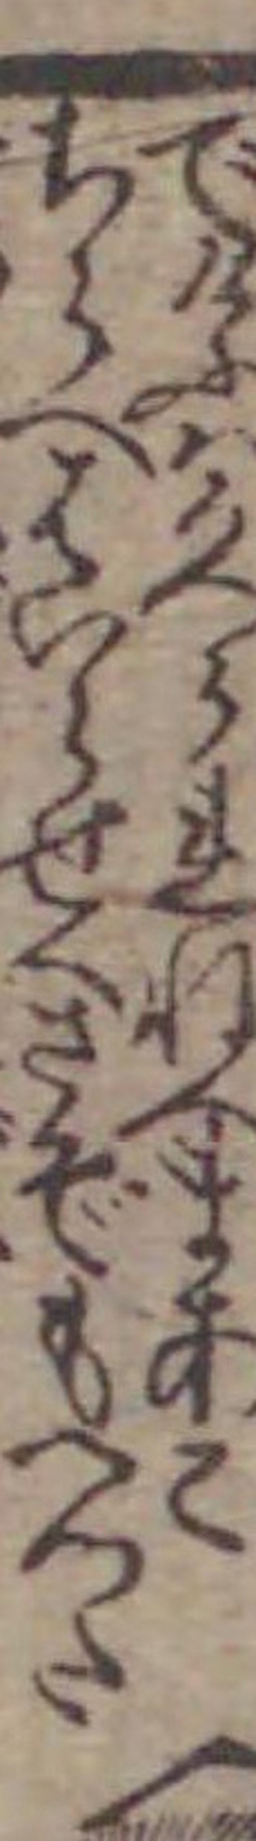ちらへはいらせへさぞもへつた
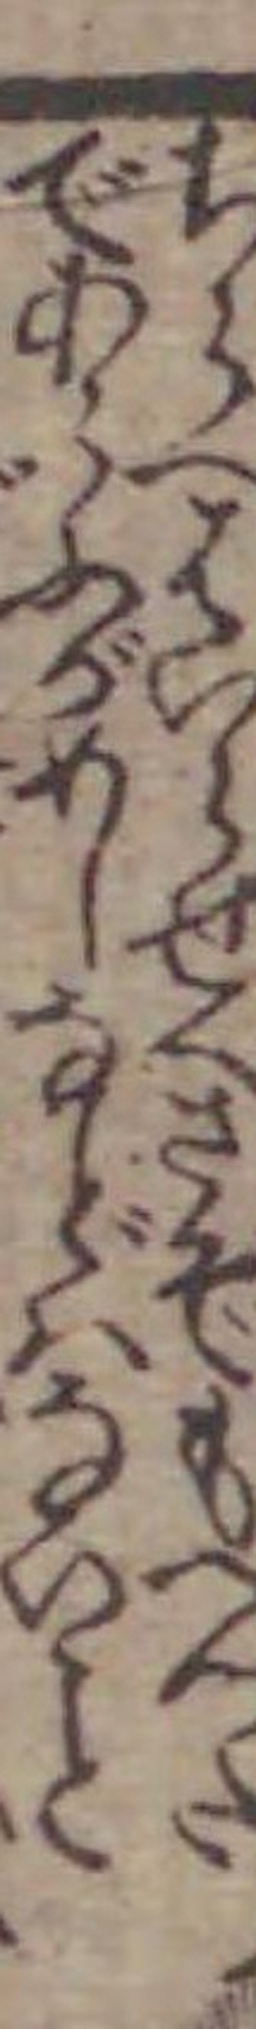であらふがめしなどはないこと
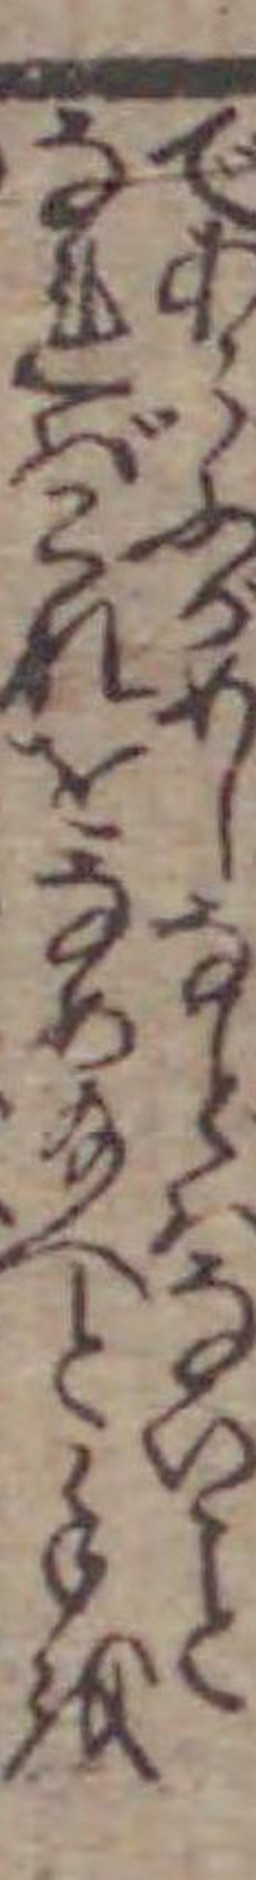なればこれをなめ給へと手を
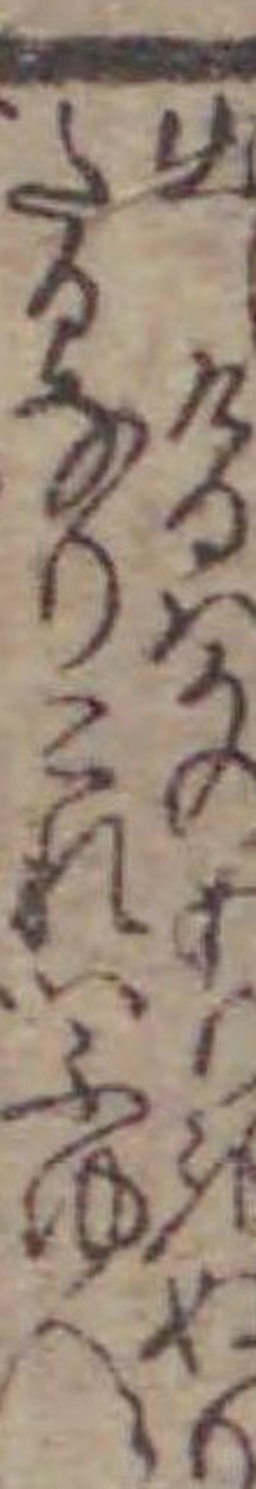たるなりこれはふゆ
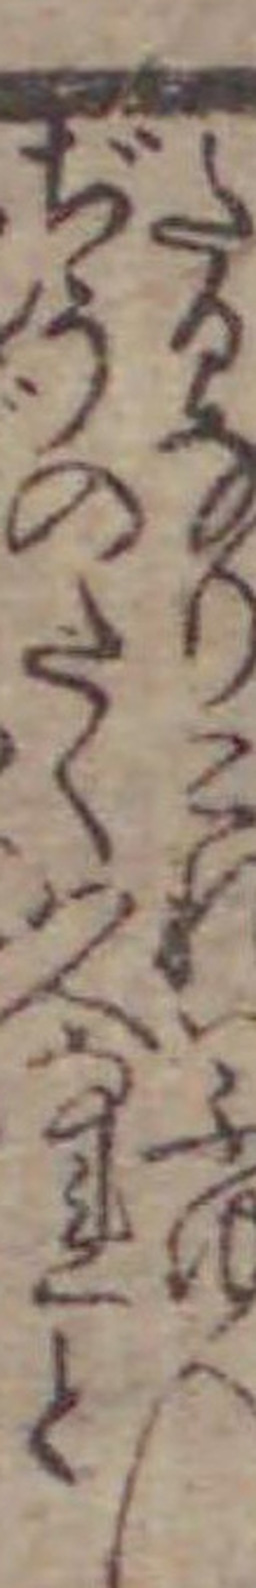ぢうのたくはへなれと
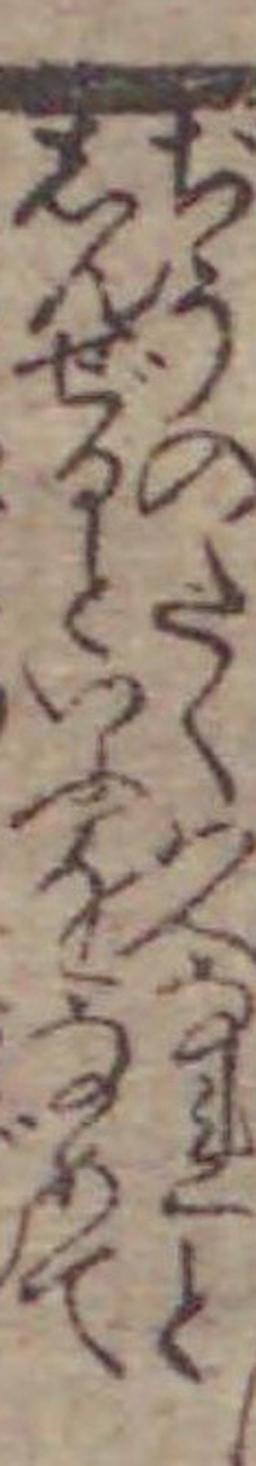しんぜるといふをなめて
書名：即席耳学問 : 3巻
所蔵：国立国会図書館 National Diet Library, JAPAN
